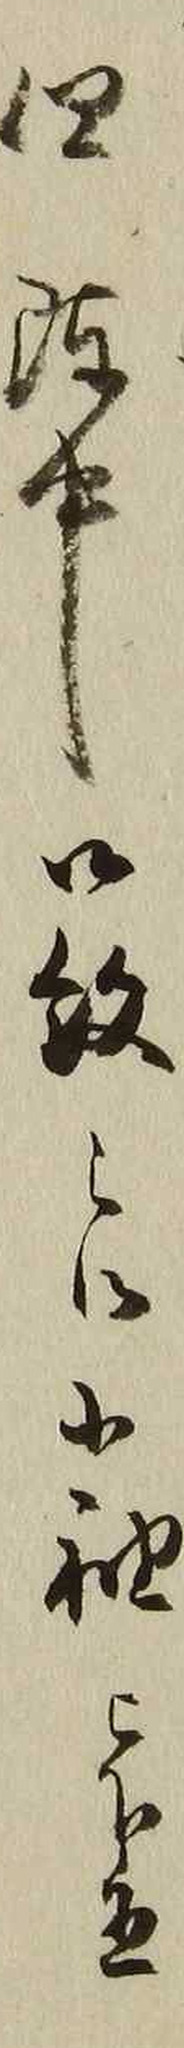但陣中御紋之御小袖被下置
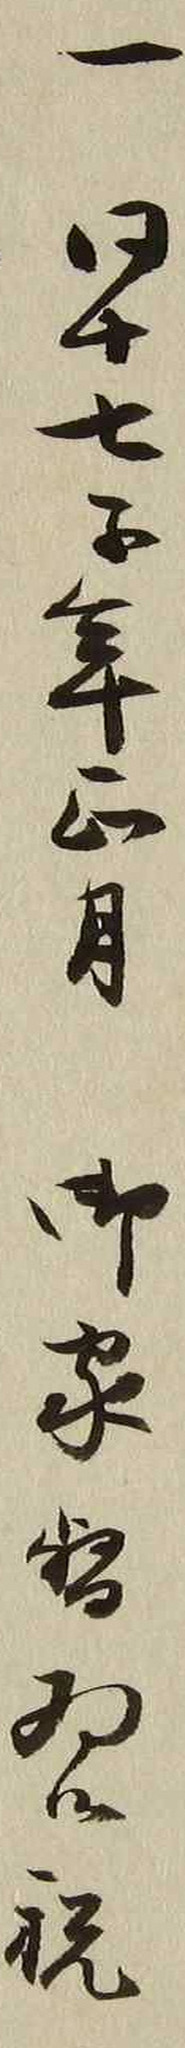一同十七子年正月御家督為御祝
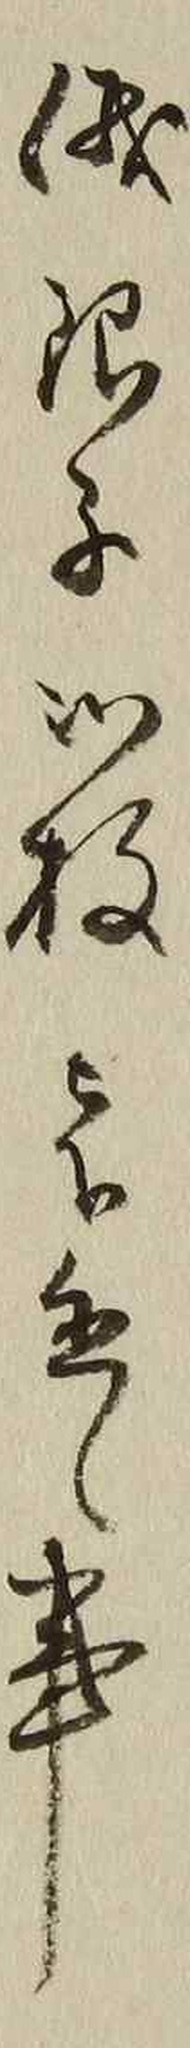儀銀子弐枚被下置候事
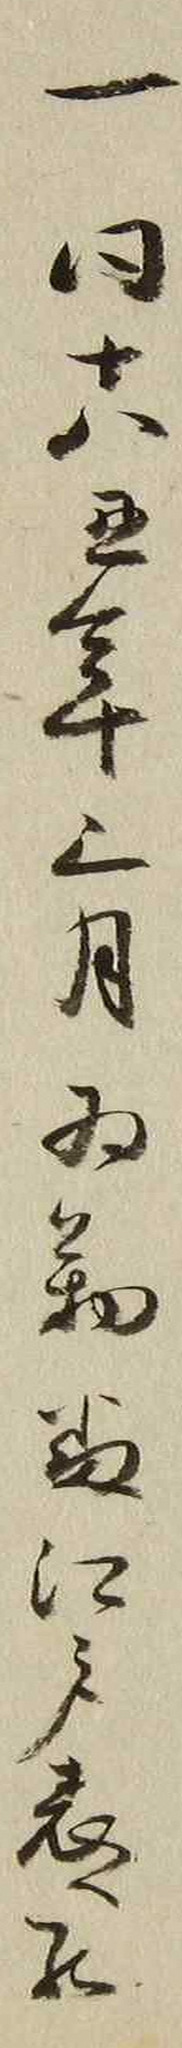一同十八丑年三月為勤番江戸表へ罷
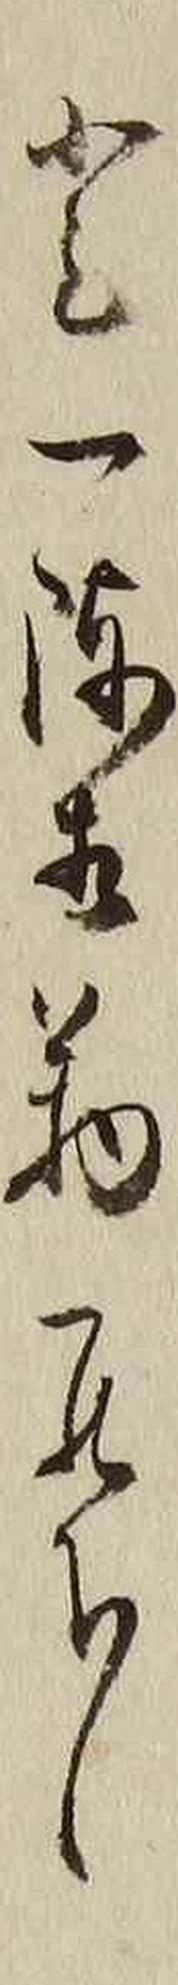登一陣相勤罷下候
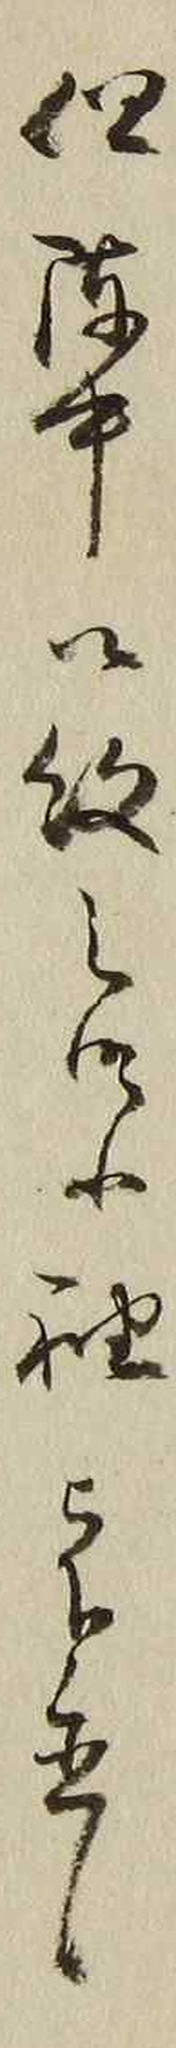但陣中御紋之御小袖被下置候
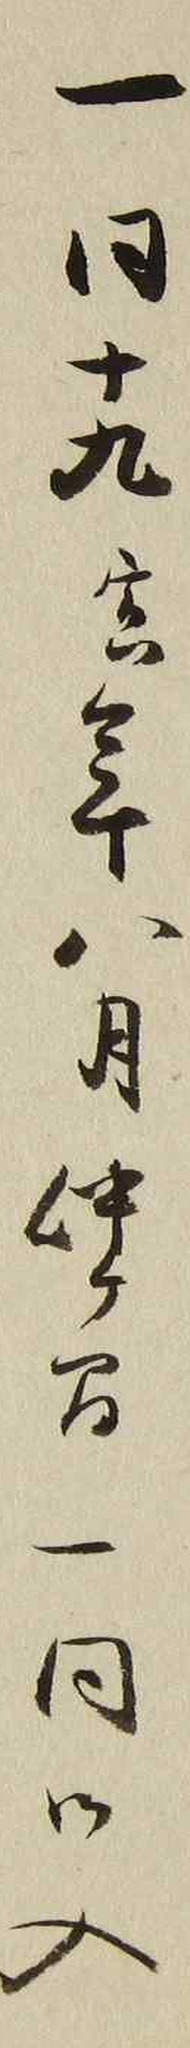一同十九寅年八月仲ヶ間一同御入
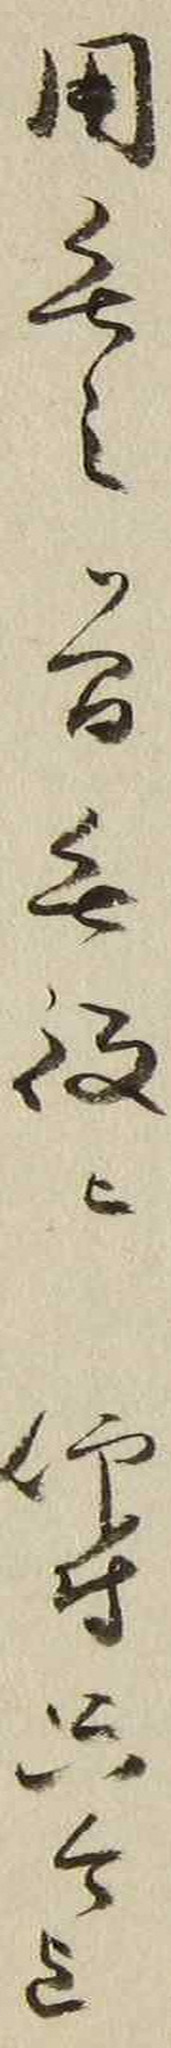用無之候間無役被仰付只今迄
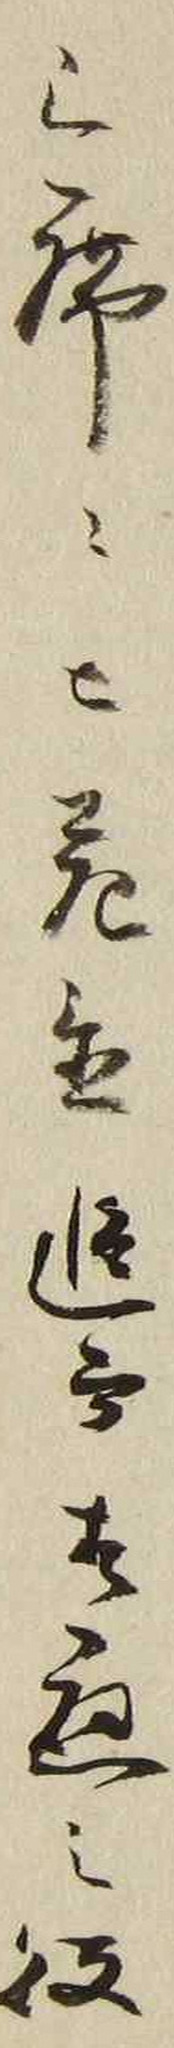之席ニ被差置追而相応之役
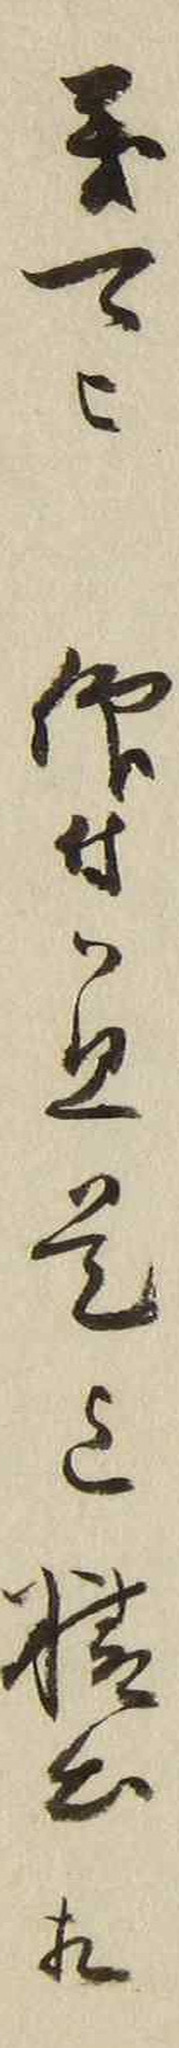義可被仰付候且是迄精出相

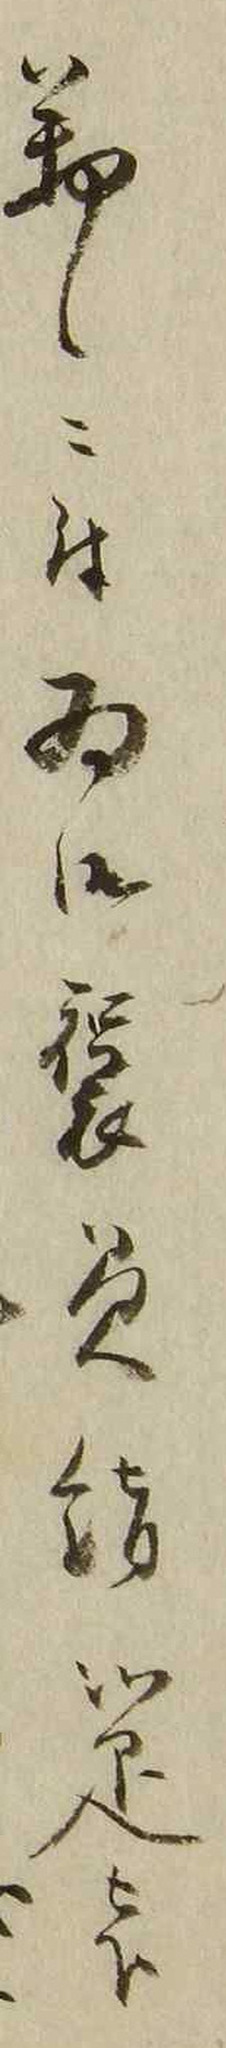勤候ニ付為御褒美絹弐疋被下
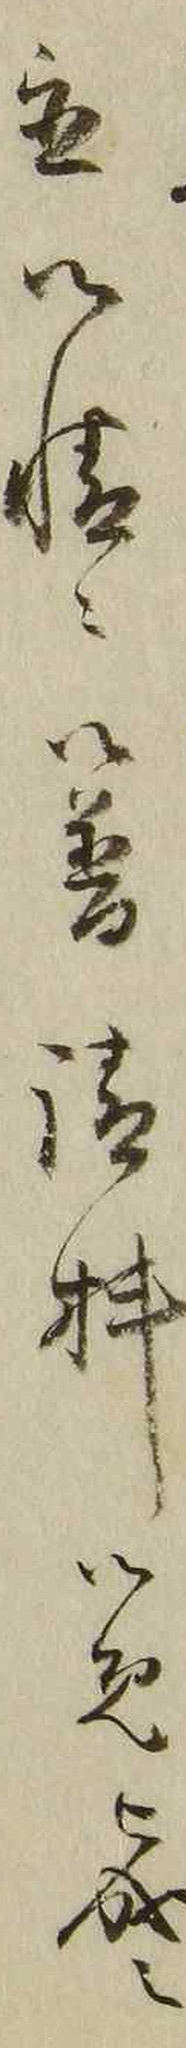置御情ニ小普請料御免被成之
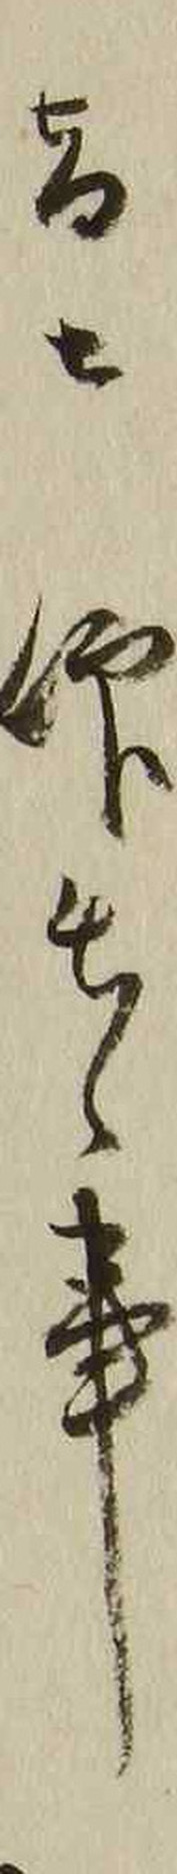旨被仰出候事
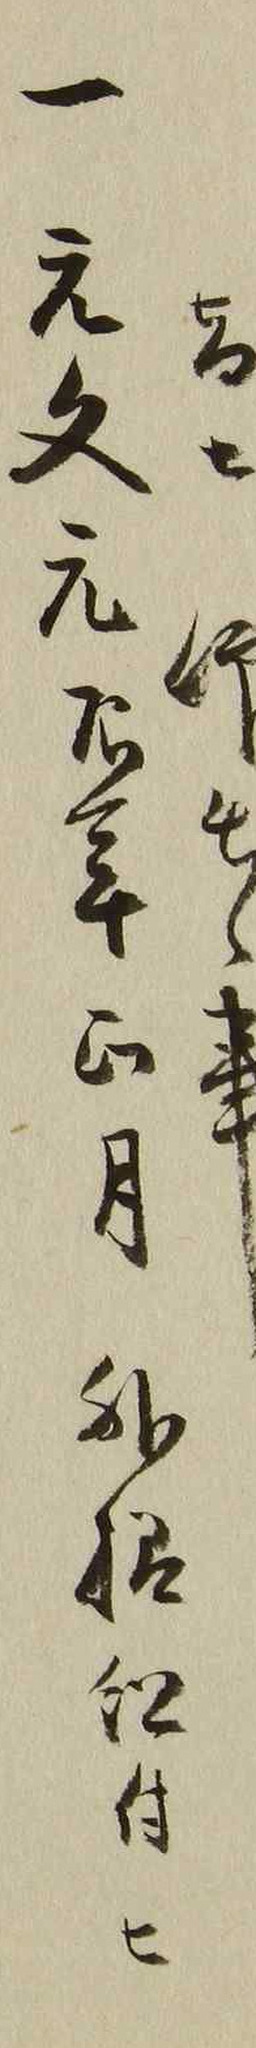一元文元辰年正月外様組付被
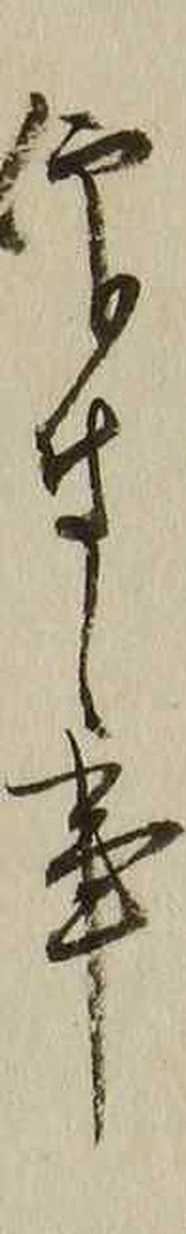仰付候事
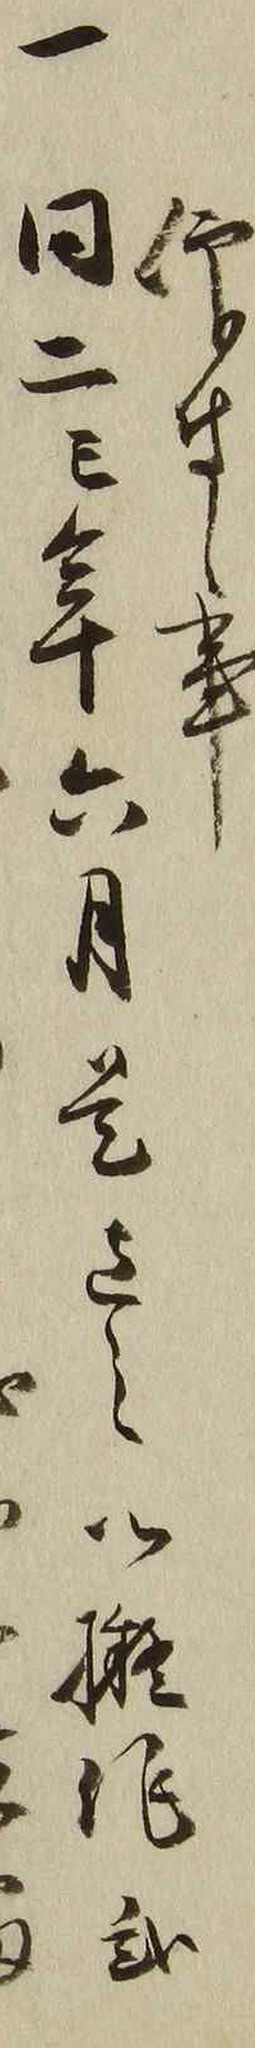一同二巳年六月是迄之御擬作弐
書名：諸士系譜　巻之288　さ之部20
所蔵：会津若松市立会津図書館
